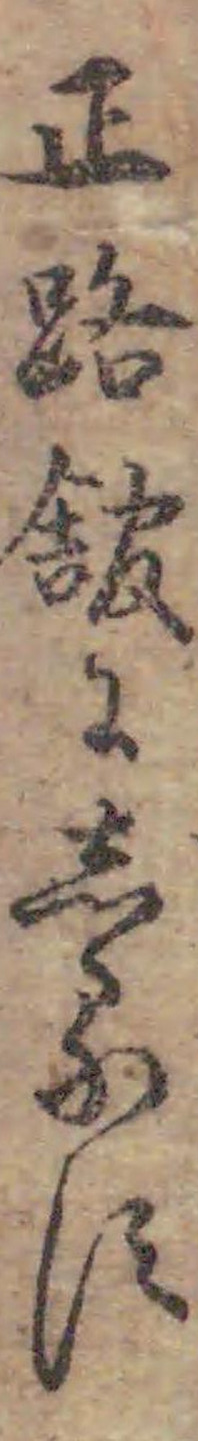正路館にしるす

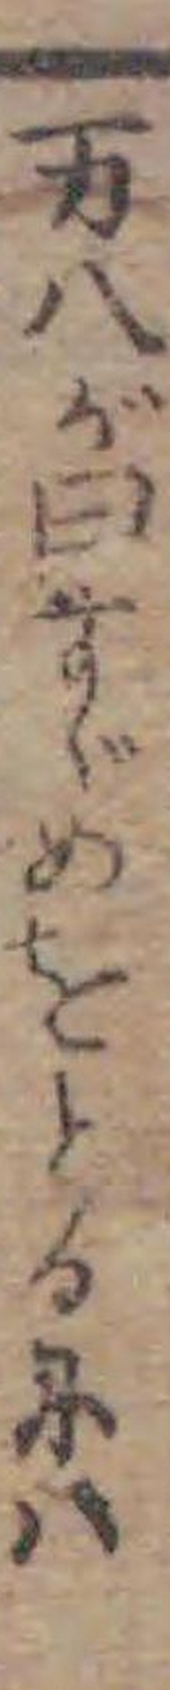万八が曰すゞめをとるには
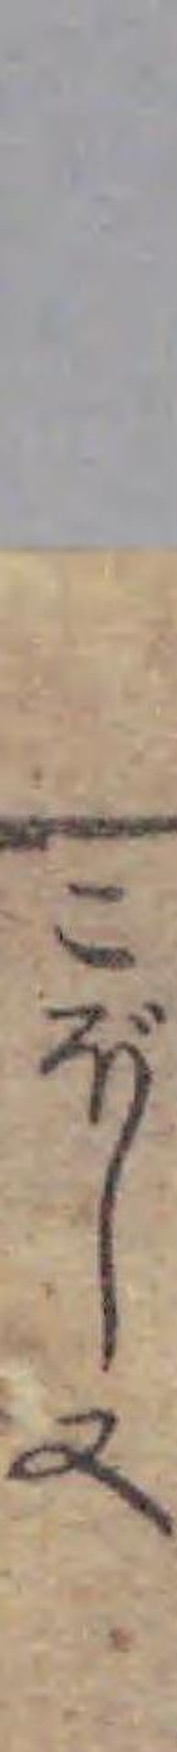こぼし又
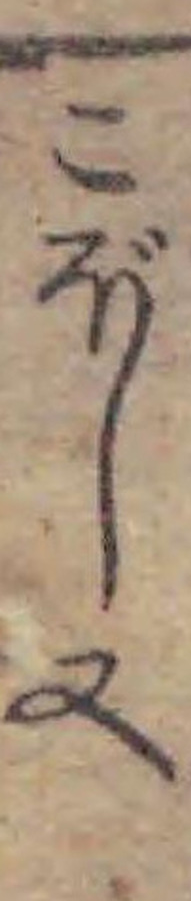こぼし又
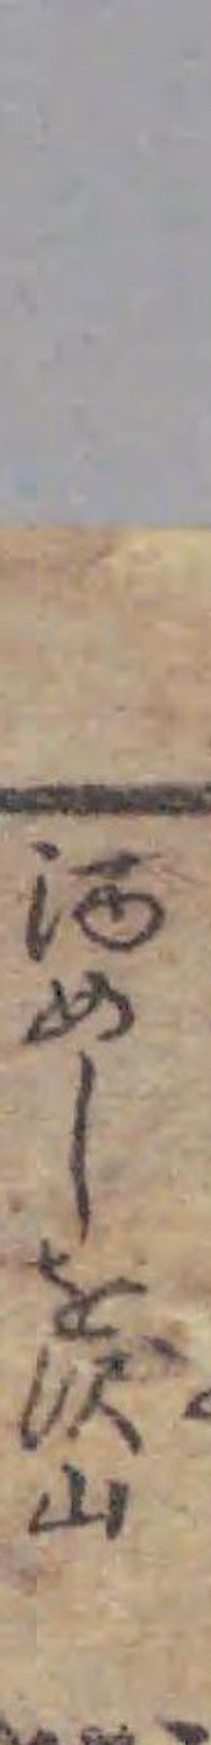酒めしを沢山
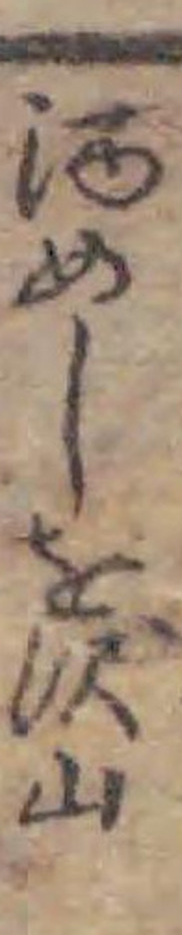酒めしを沢山
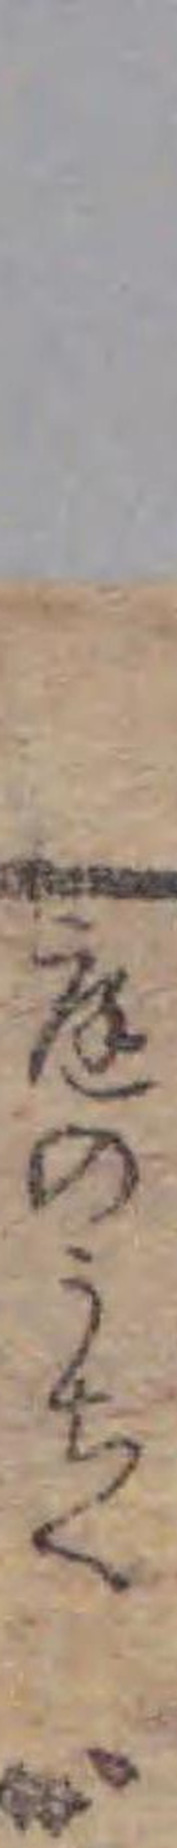庭のうちへ
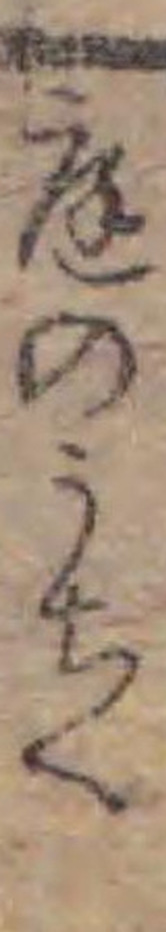庭のうちへ
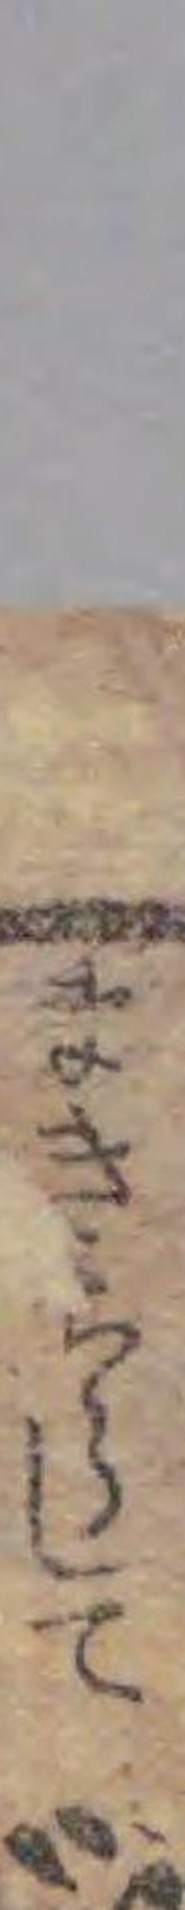まきちらして
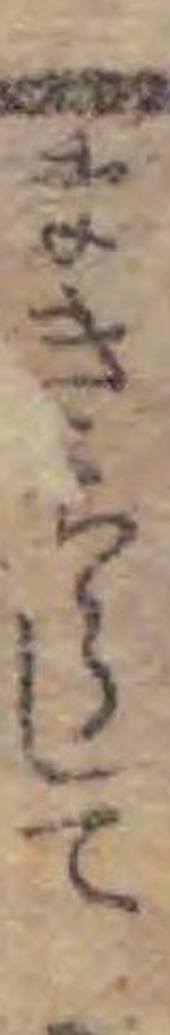まきちらして
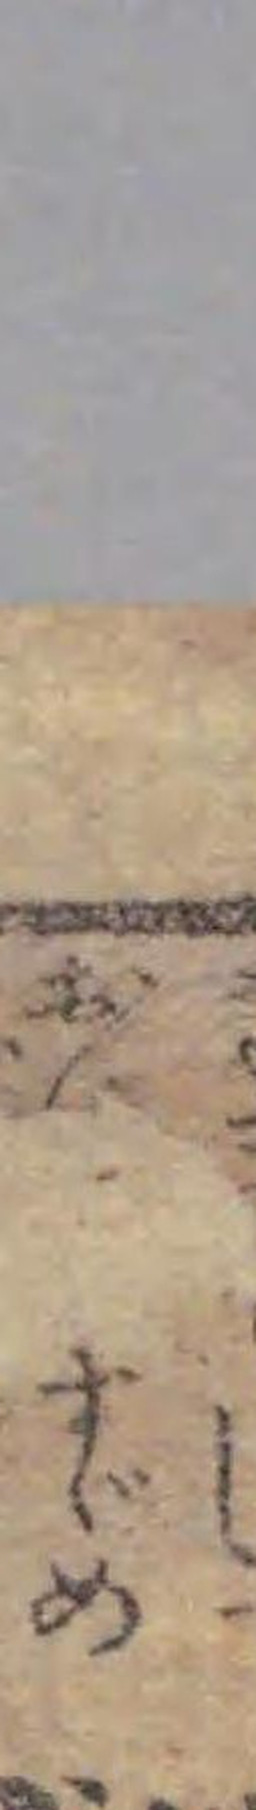すゞめど
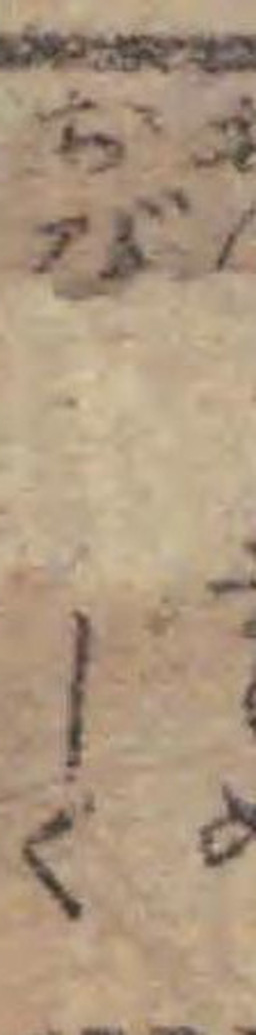おびしく
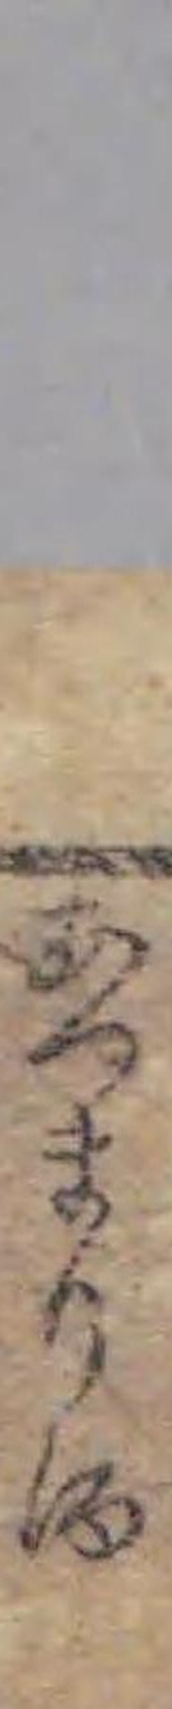あつまり酒
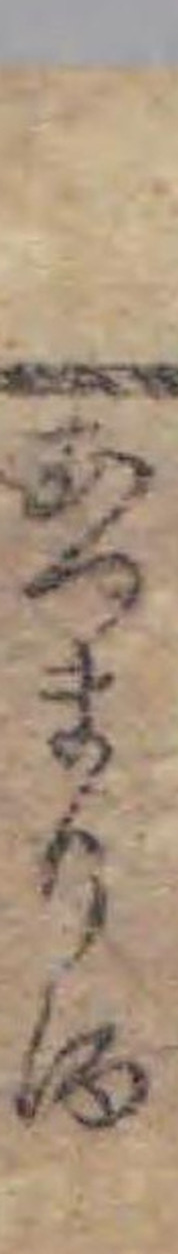あつまり酒
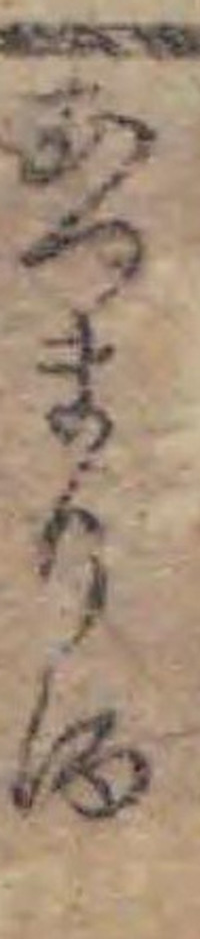あつまり酒
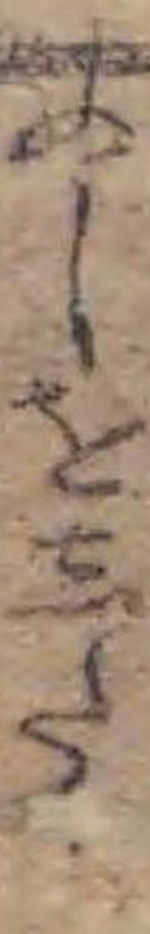めしをした
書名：虚言八百万八伝 : 3巻
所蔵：国立国会図書館 National Diet Library, JAPAN
